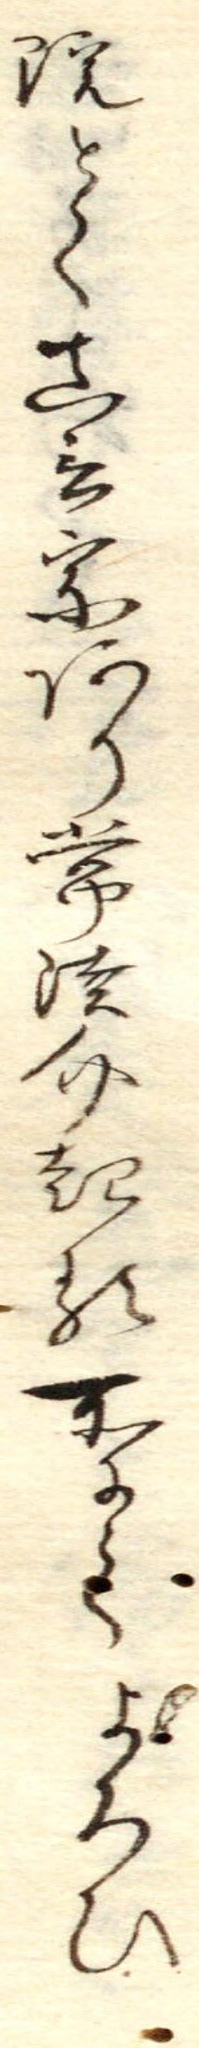院とて真言宗あり常陸介起る所にてよろひ

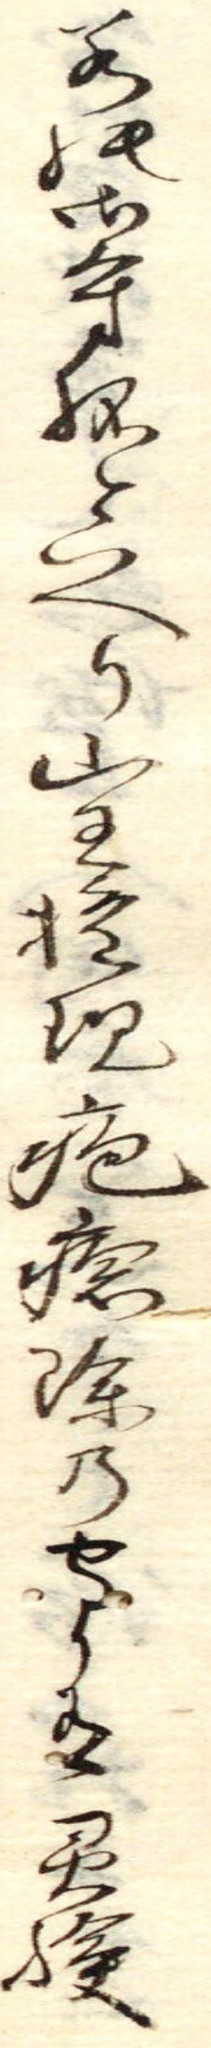若の御寺抔といへり山王権現疱瘡除の守り有霊験
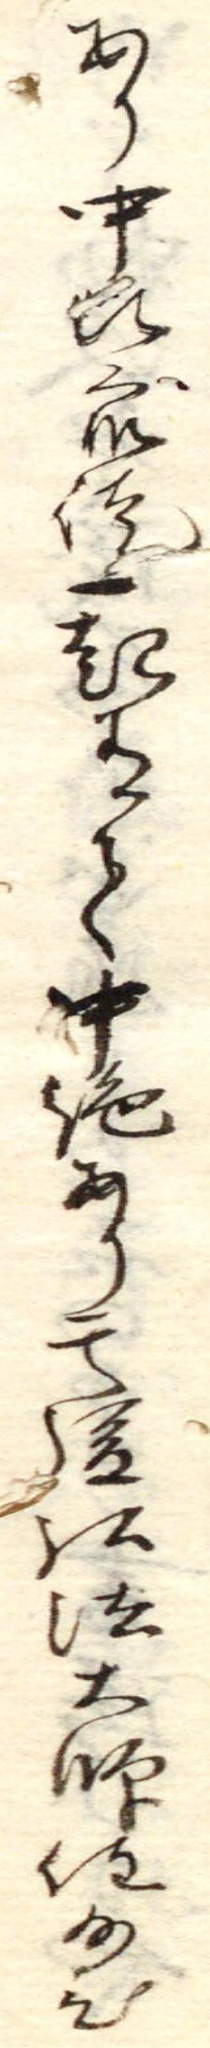あり中頃衆徒一起有て中絶ああり其後弘法大師住給ひ
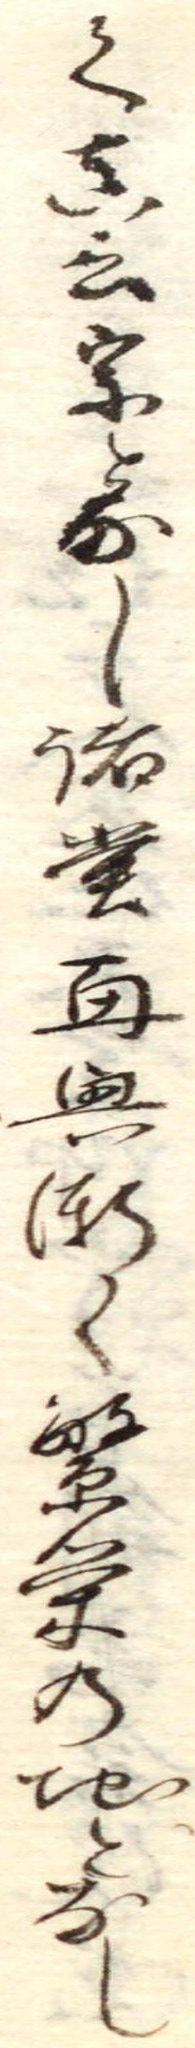て真言宗となし諸堂再興漸く繁栄の地となし
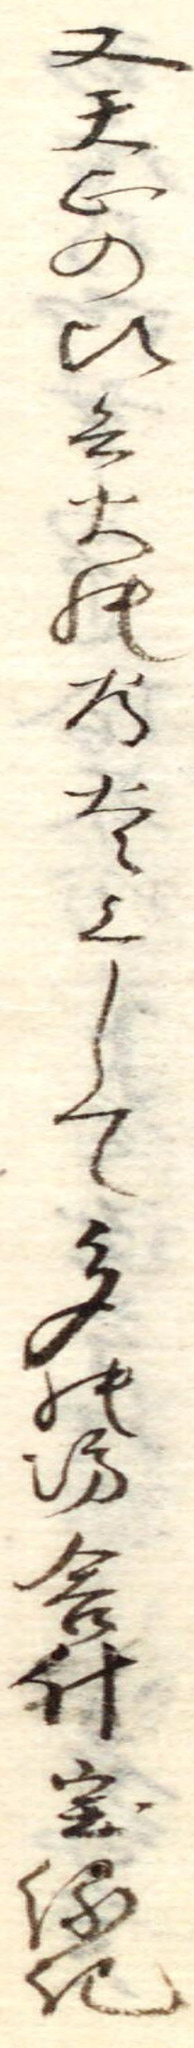又天正の頃兵火の為炎上して多の坊舎什宝縁起
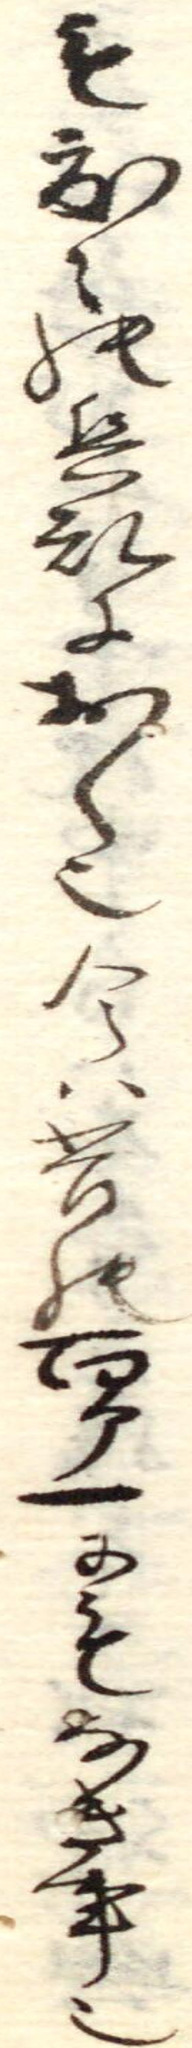も度々の兵乱におく也今は昔の百部一にもなき事也
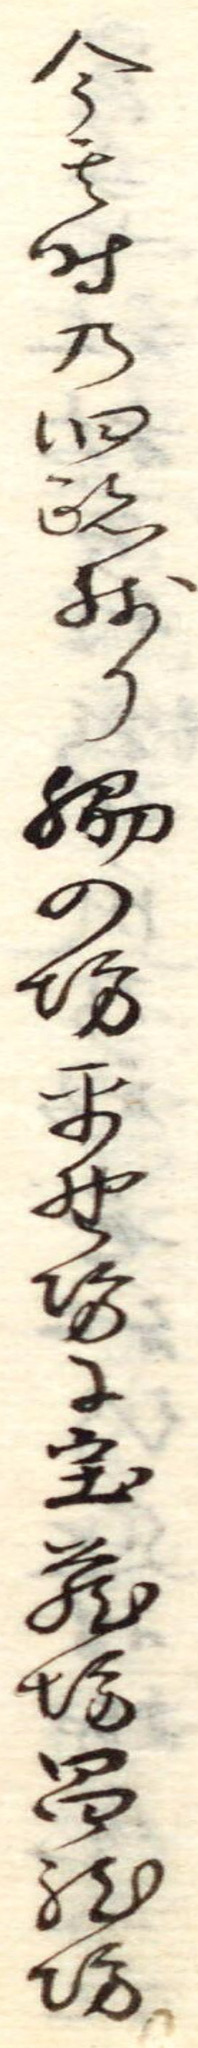今其時の旧跡残り脇の坊平野坊に宝蔵坊昌龍坊
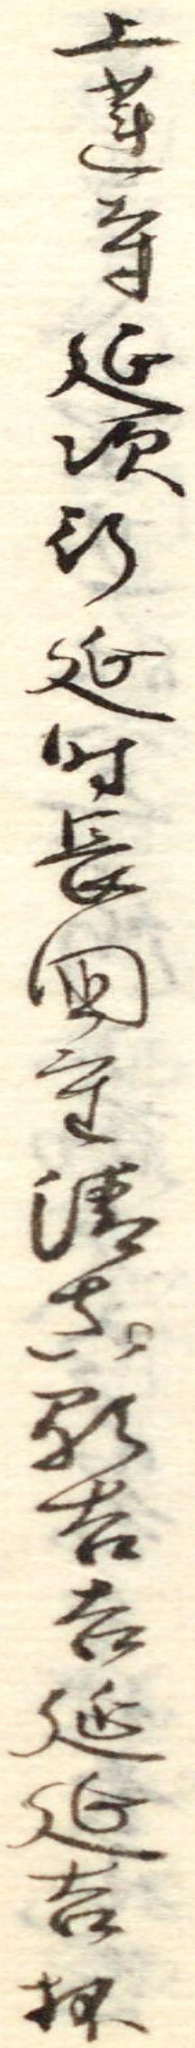上蓮寺延次行延時長国重清真顕吉吉延延吉抔
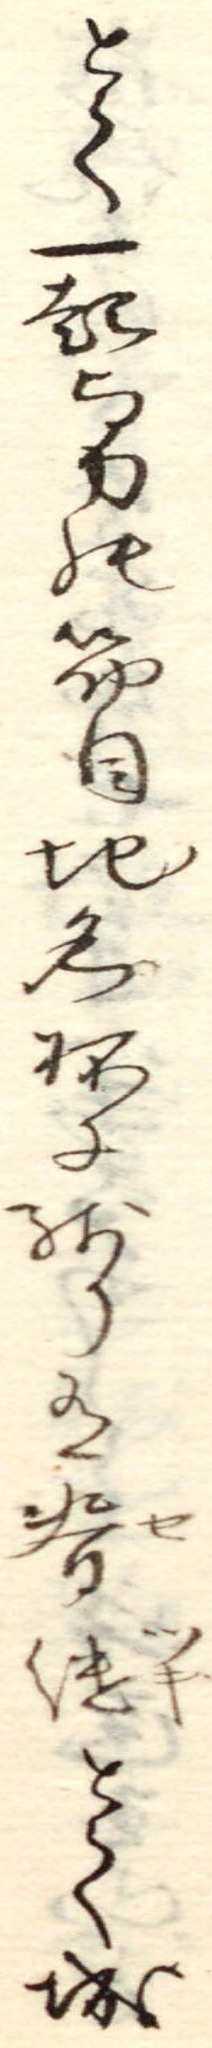とて一起与力の筋目地名抔に残り有脊継とて城
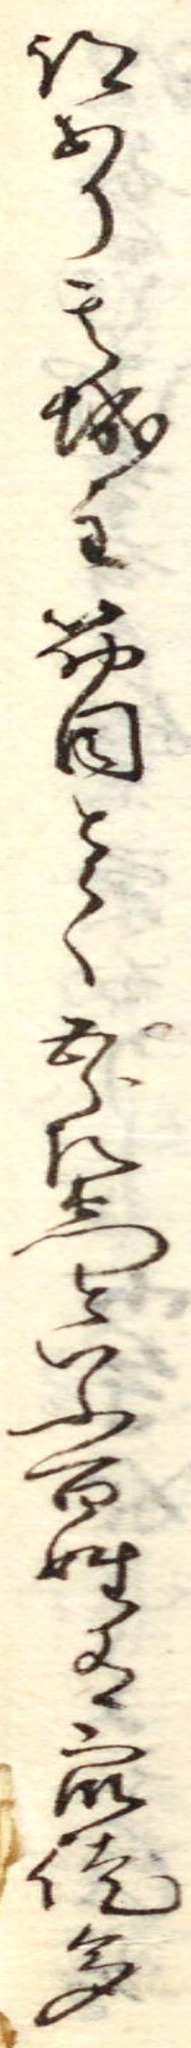跡あり其城主筋目とて五郎左衛門といふ百姓有衆徒多
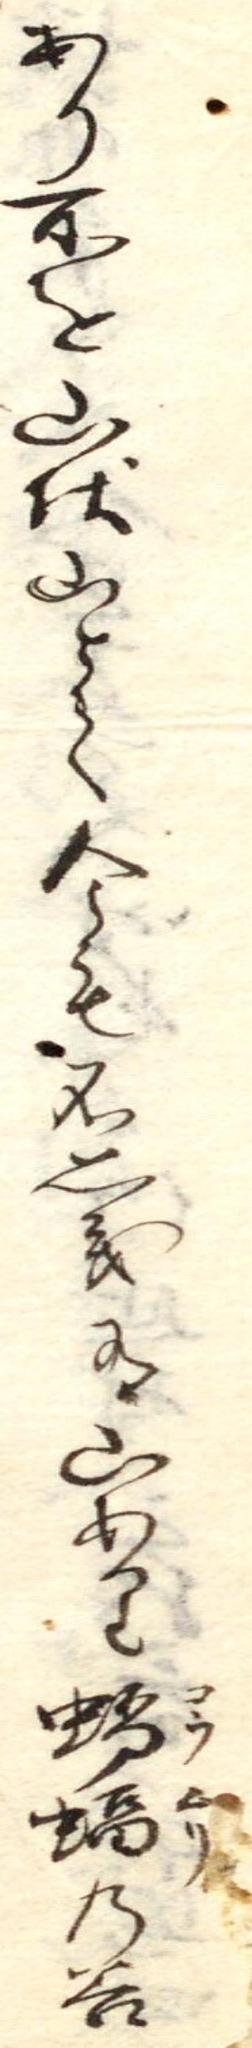あり所を山伏山とて今も不思義有山あり蝙蝠の谷
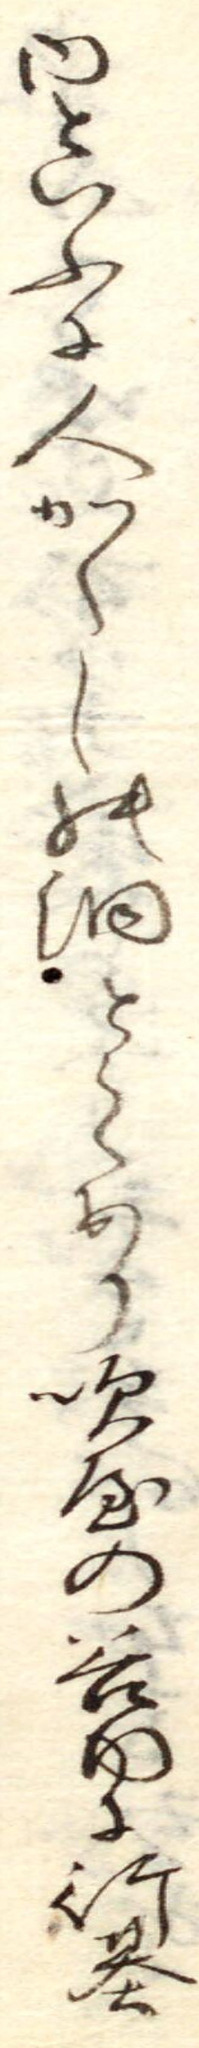内といふに人かくしの洞とてあり吹屋の谷内に行基
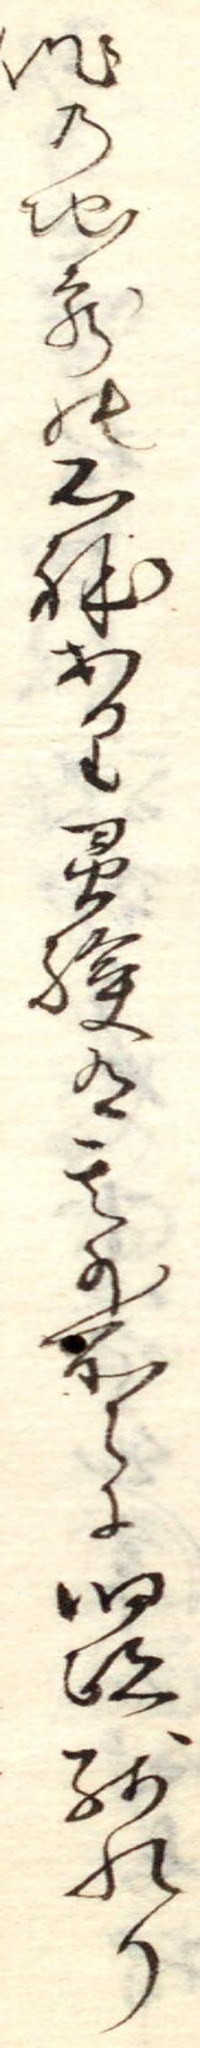作の地蔵の石躰あり霊験有其外所々に旧跡残れり
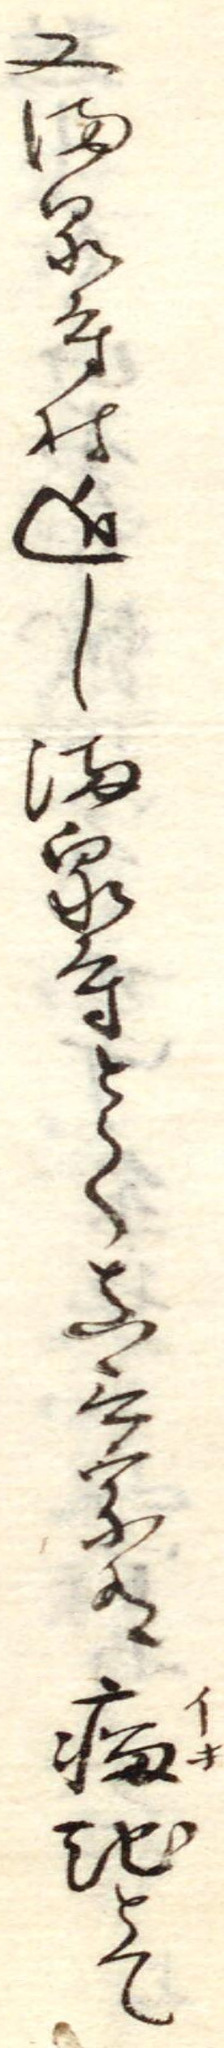又満泉寺村近し満泉寺とて真言宗有病池とて
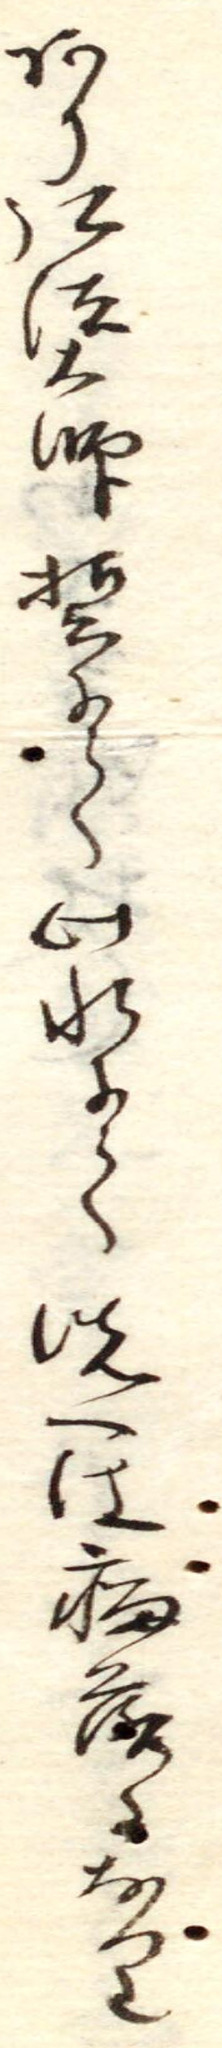あり弘法大師誓にて此水にて洗へは病落になり
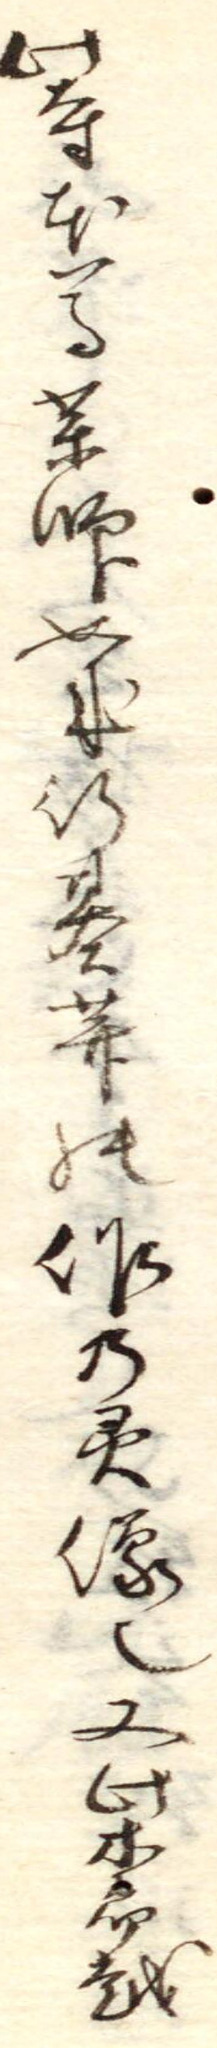此寺本尊薬師如来行基菩薩の作の霊像也又此木郎越
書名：能登名跡誌
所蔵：Ishikawa Prefectural Library
